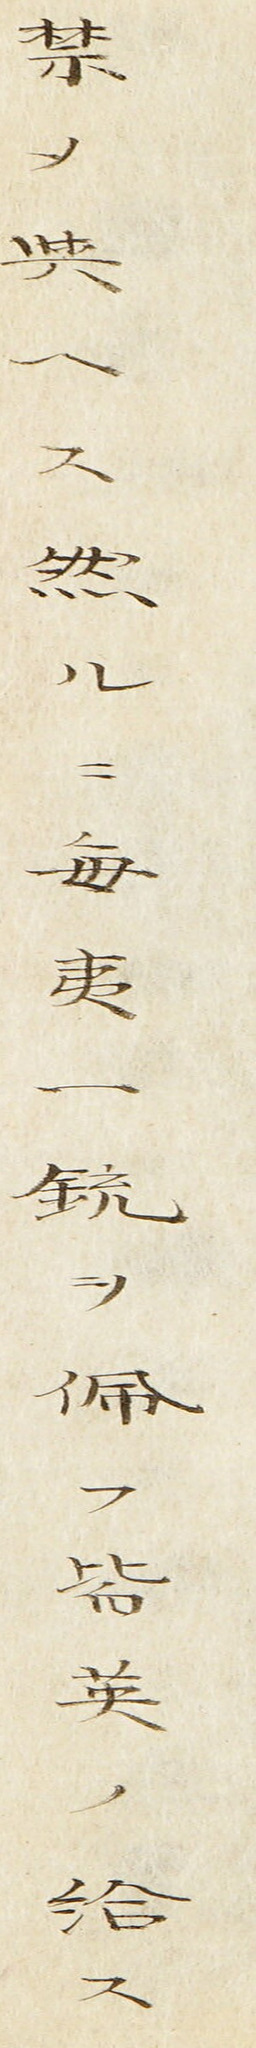禁シテ与ヘス然ルニ毎夷一銃ヲ佩フ皆英ノ給ス
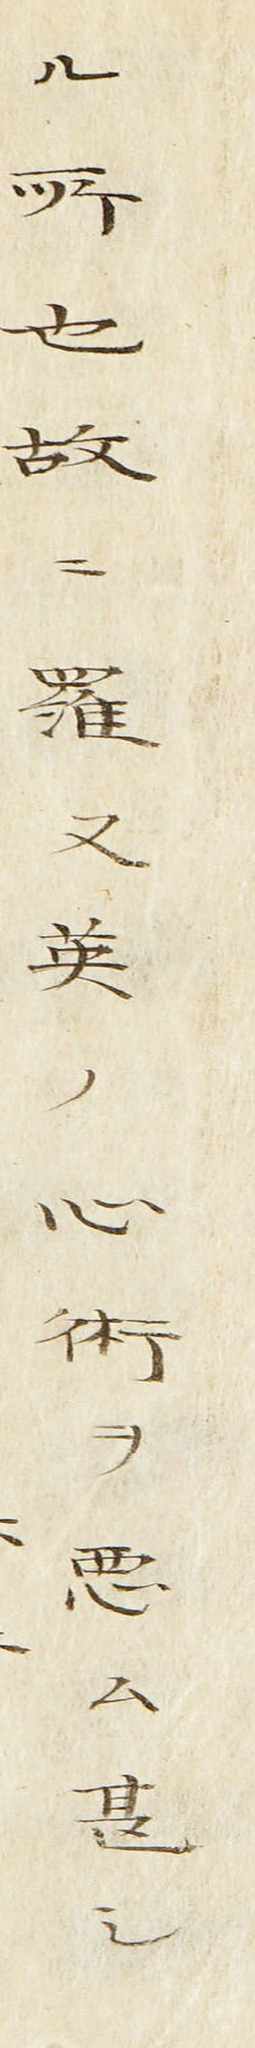ル所也故ニ羅又英ノ心術ヲ悪ム甚シ
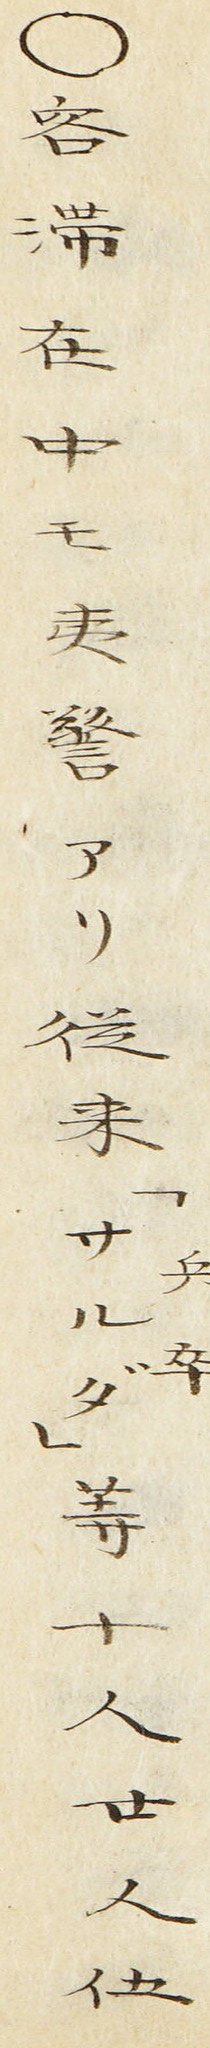〇客滞在中モ夷警アリ従来「サルダ」等十人廿人伍

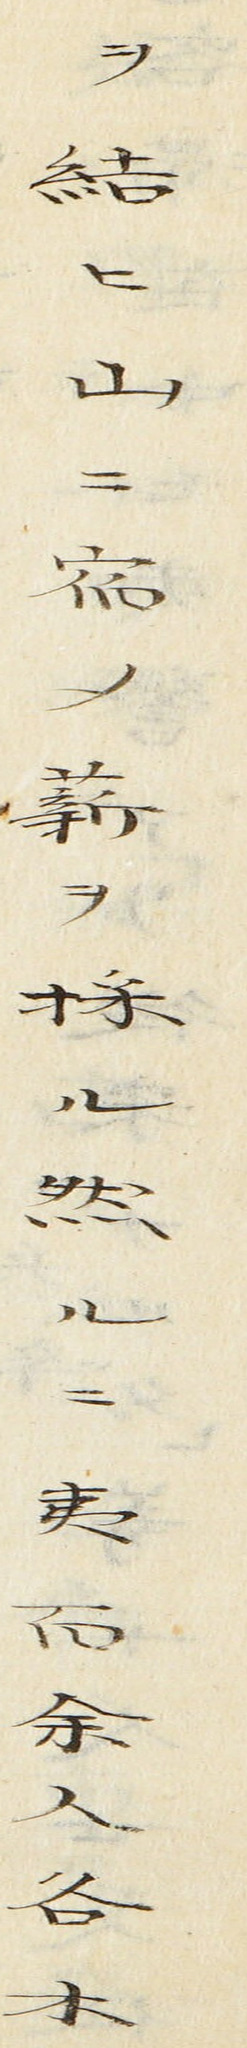ヲ結ヒ山ニ宿シテ薪ヲ採ル然ルニ夷百余人各木
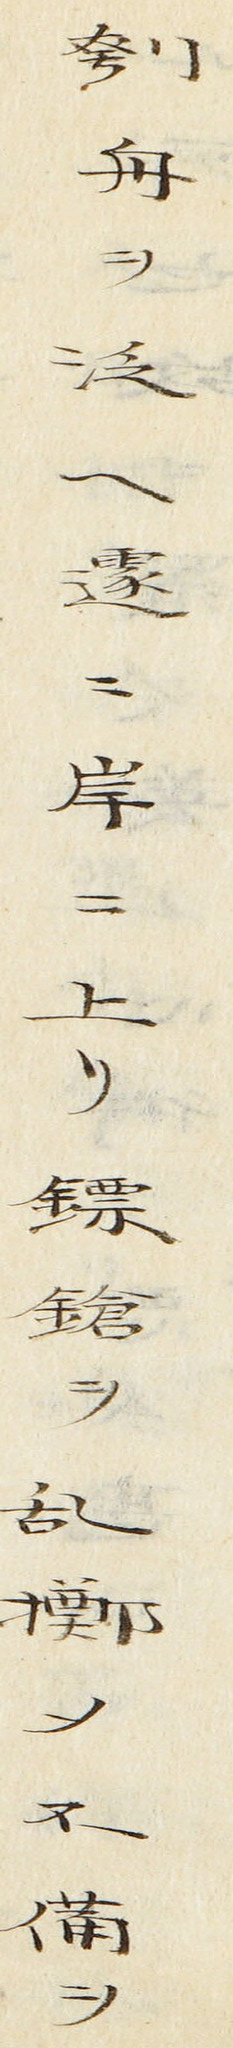刳舟ヲ泛ヘ遽？ニ岸ニ上リ鏢鎗ヲ乱擲シテ不備ヲ
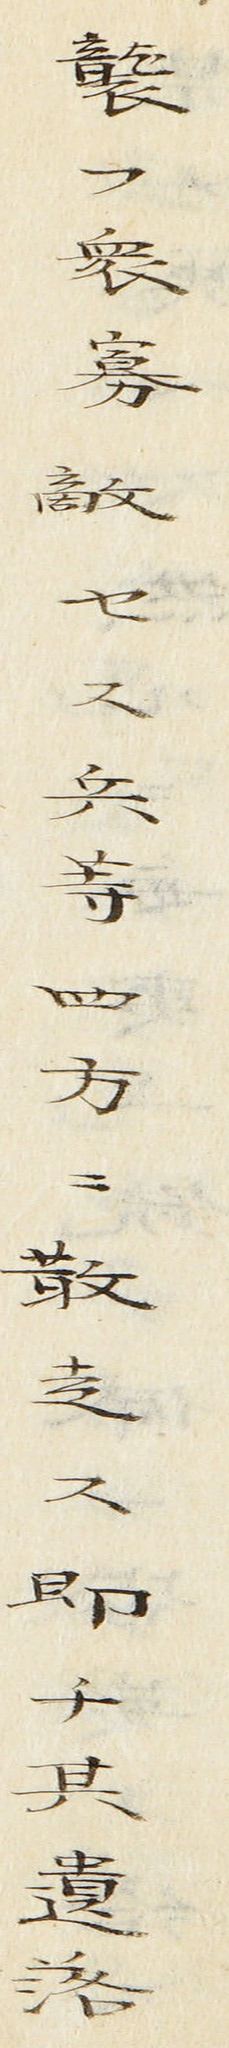襲フ衆寡敵セス兵等四方ニ散走ス即チ其遺落
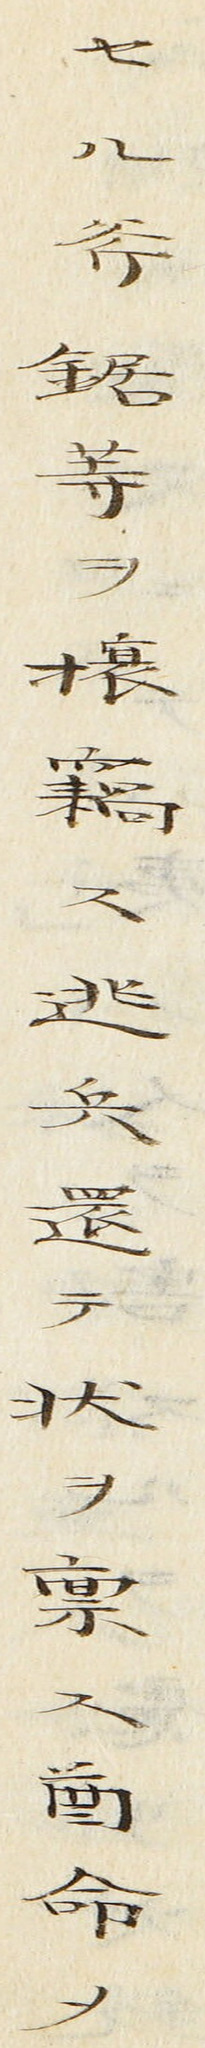セル斧鋸等ヲ攘竊ス逃兵還テ状ヲ稟ス酋命シテ
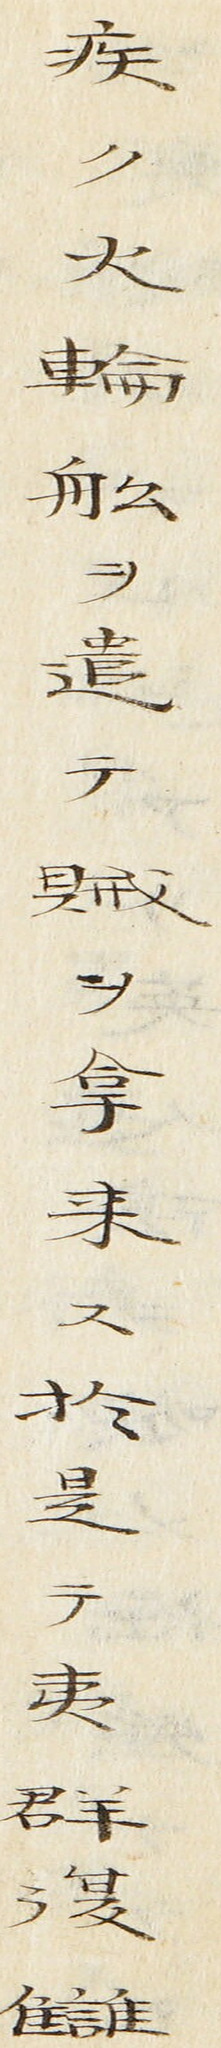疾ク火輪舩ヲ遣テ賊ヲ拿来ス於是テ夷群復讎
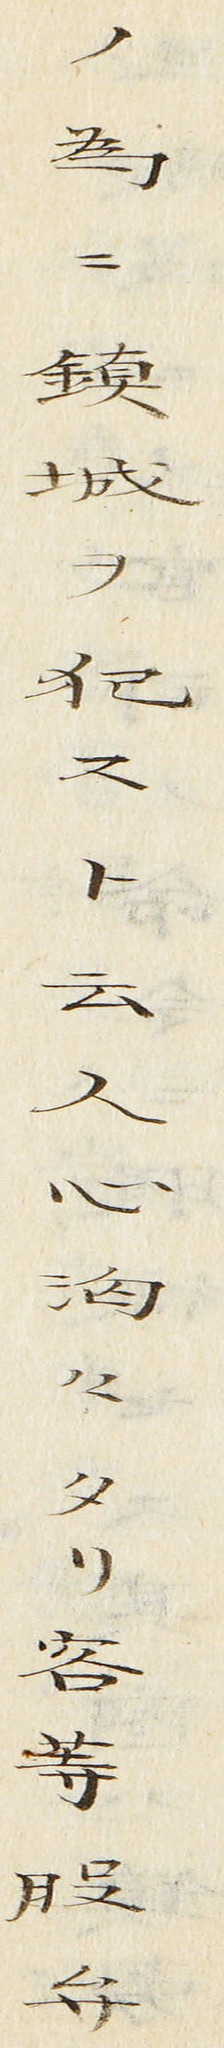ノ為ニ鎮城ヲ犯スト云人心洶々タリ客等股弁
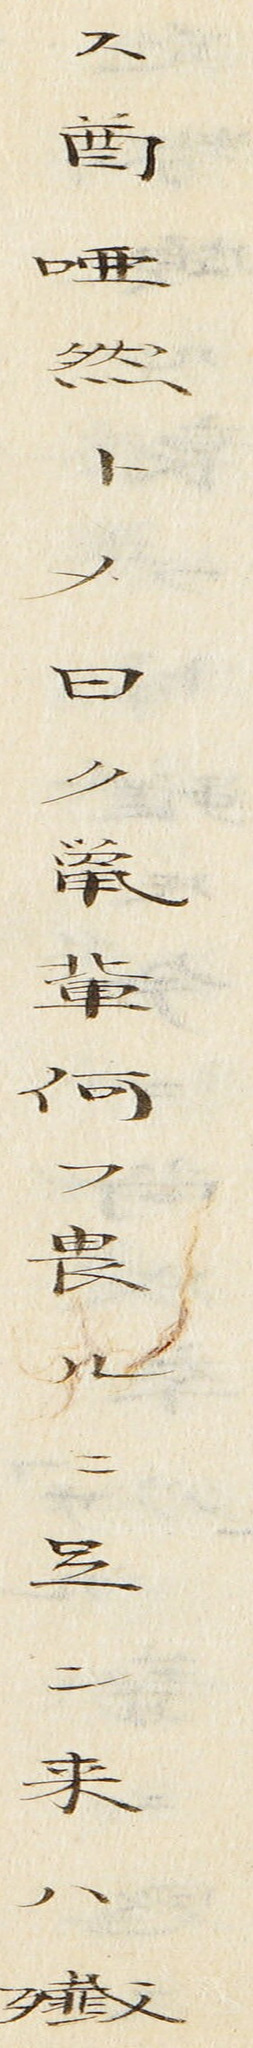ス酋啞然トシテ曰ク鼠輩何ソ畏ルニ足ン来ハ殲
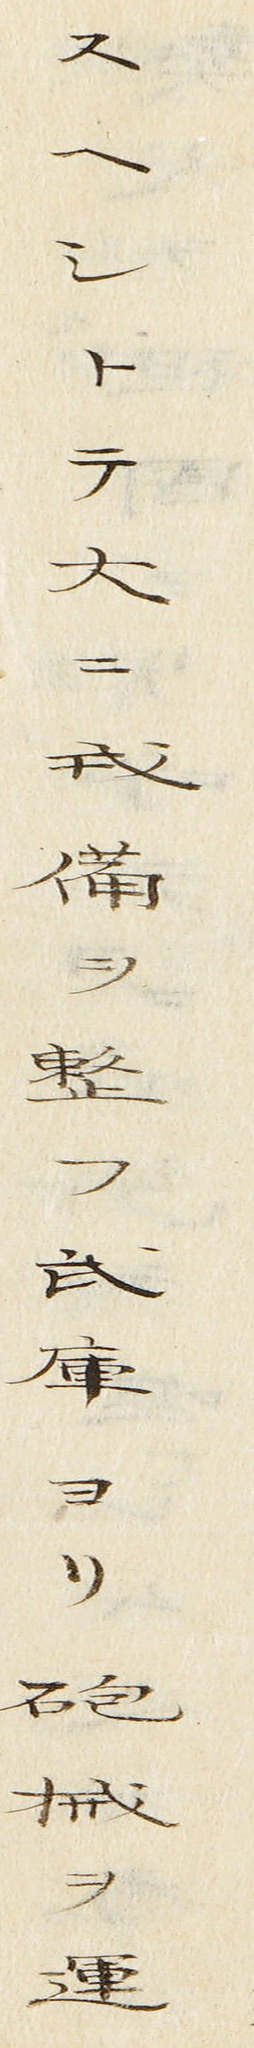スヘシトテ大ニ戎備ヲ整フ武庫ヨリ砲械ヲ運
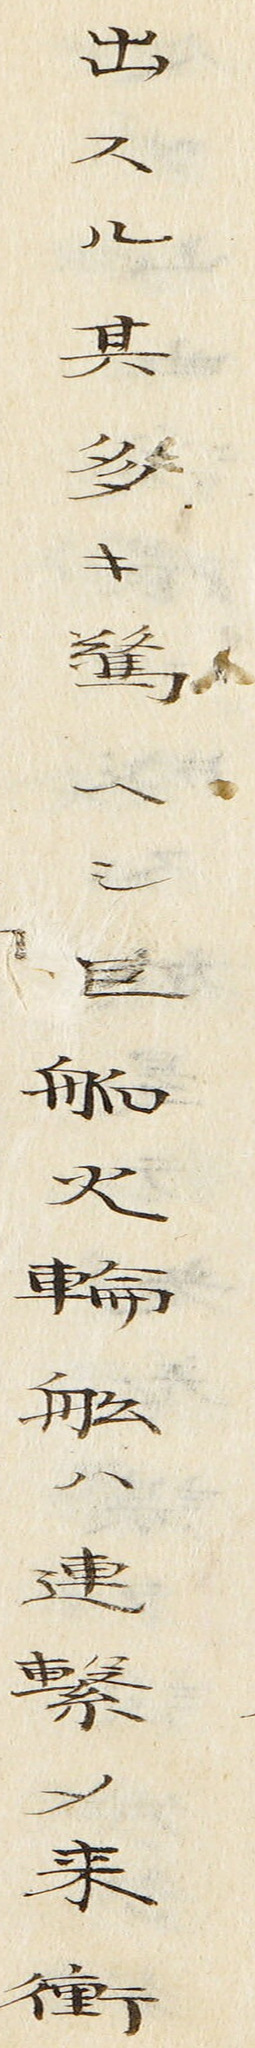出スル其多キ驚ヘシ巨舶火輪舩ハ連繋シテ来衝
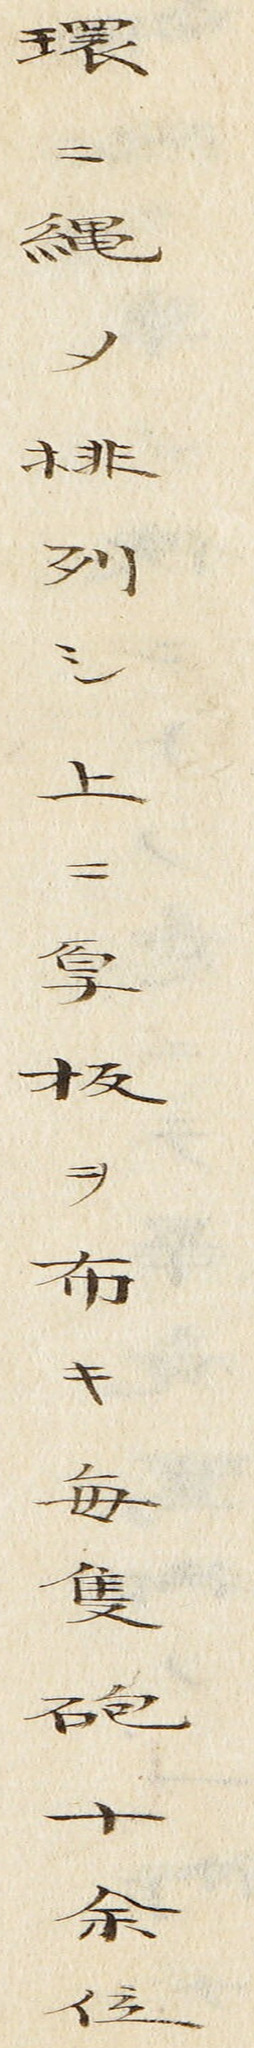環ニ縄シテ排列シ上ニ厚板ヲ布キ毎隻砲十余位
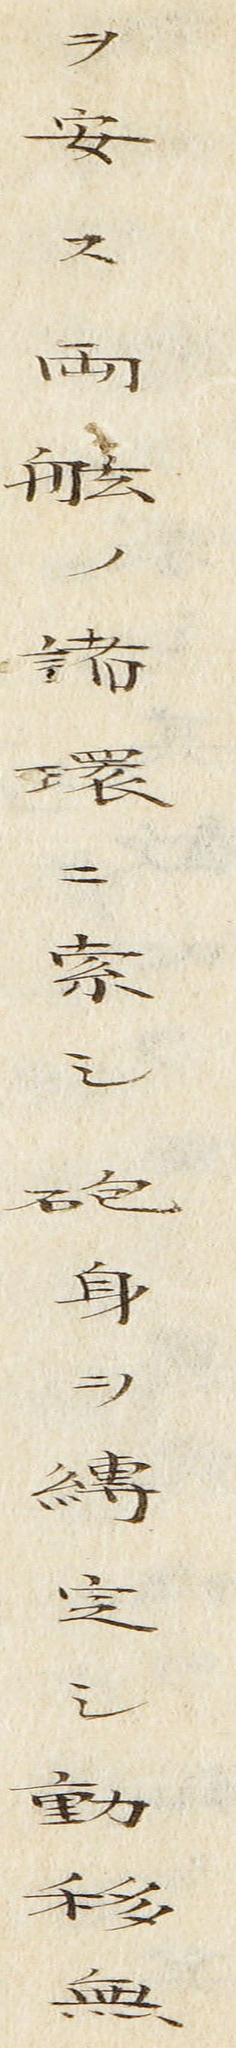ヲ安ス両舷ノ諸環ニ索シ砲身ヲ縛定シ動移無
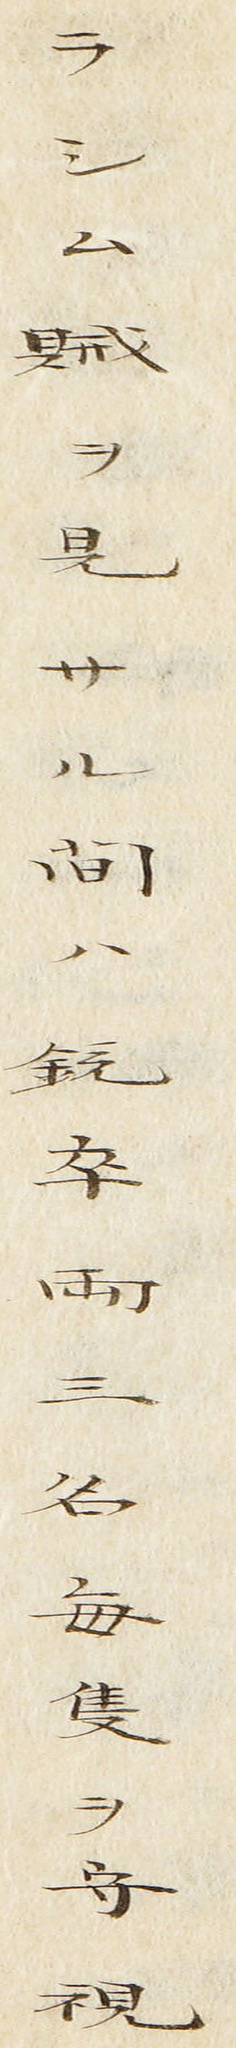ラシム賊ヲ見サル間ハ銃卒両三名ｍ毎隻ヲ守視
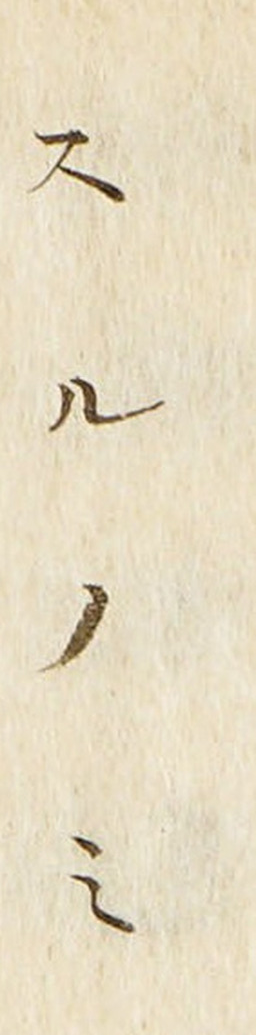スルノミ
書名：蕃談
